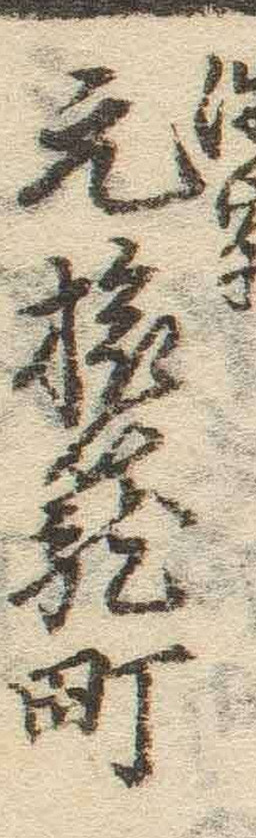通旅籠町
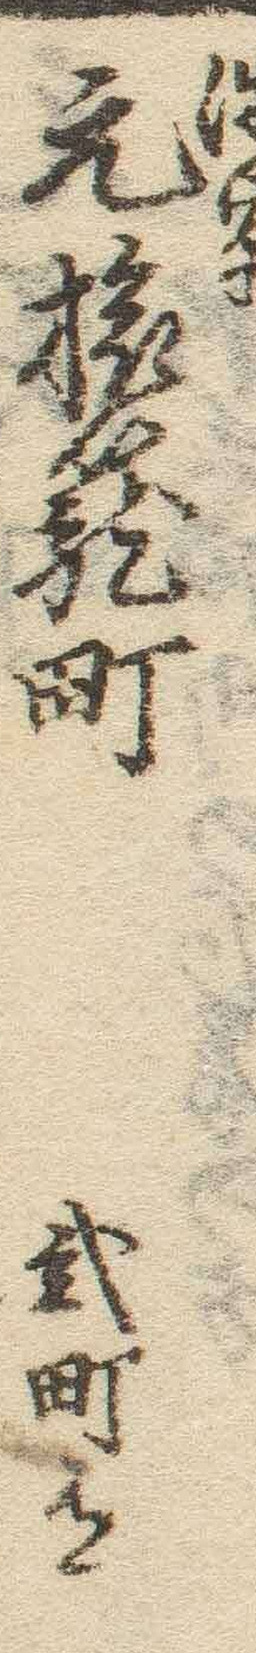元旅籠町弐町有
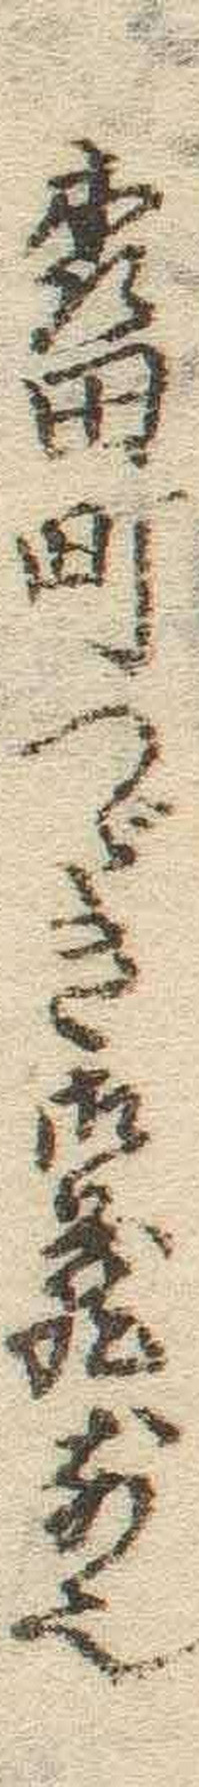森田町つゞき御蔵前也
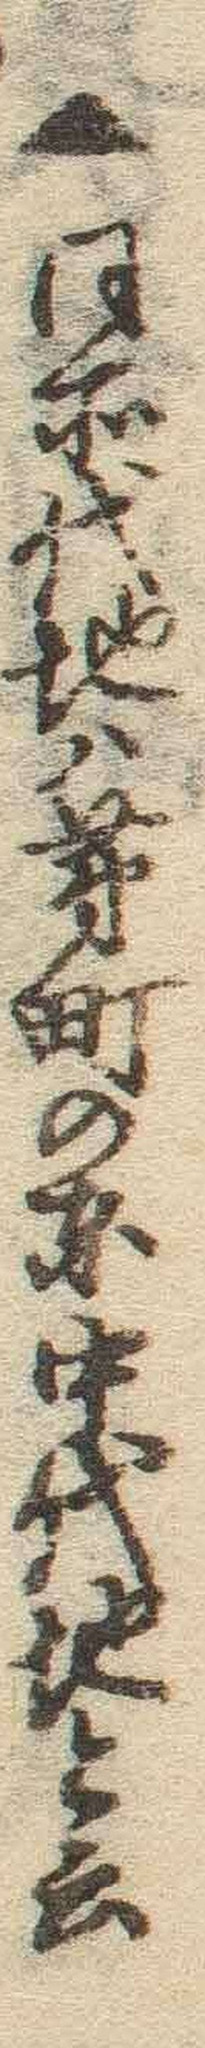▲同所代地は茅町の東中代地と云
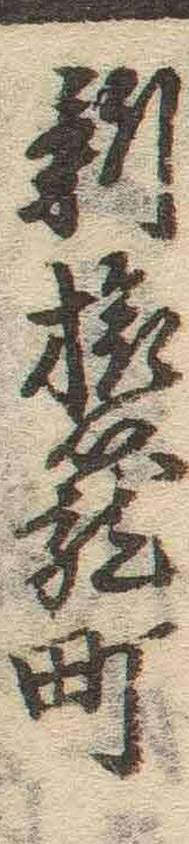新旅籠町

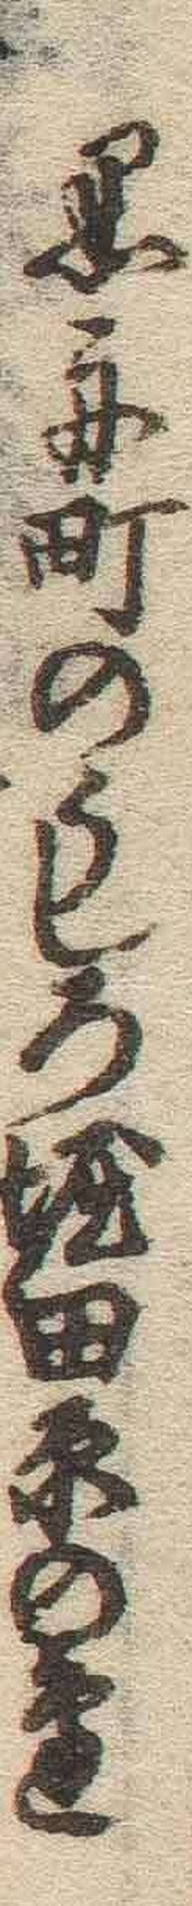黒船町のうしろ堀田原の辺
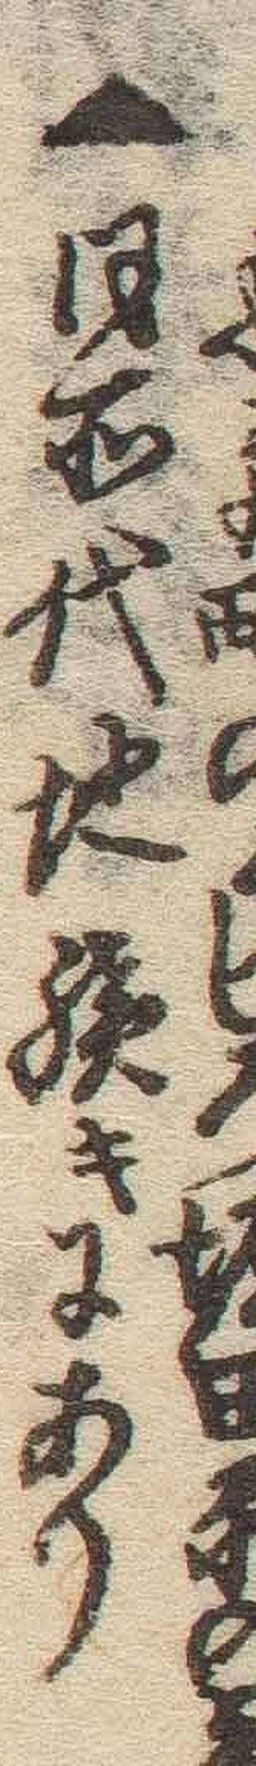▲同所代地続きにあり
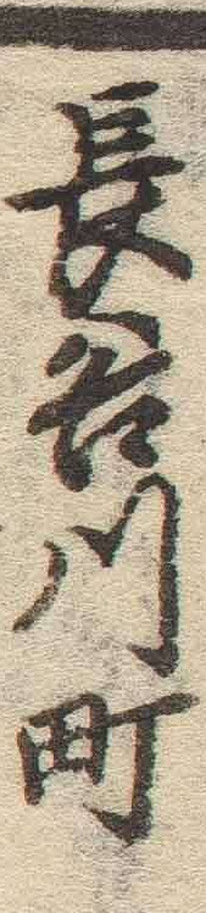長谷川町
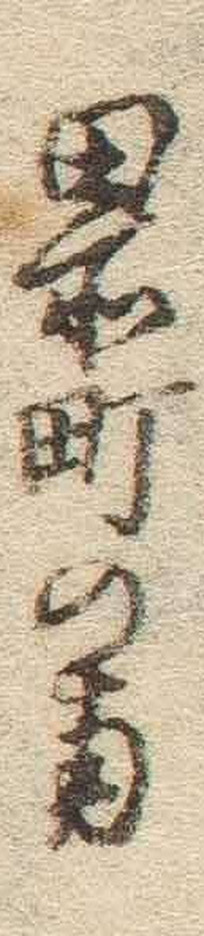田所町の南
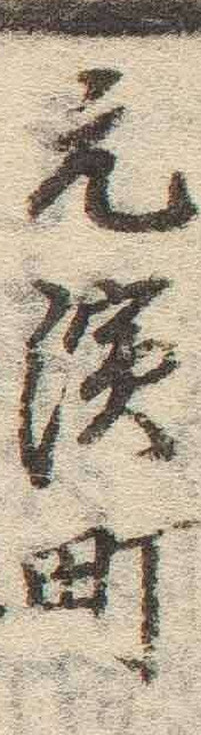元浜町
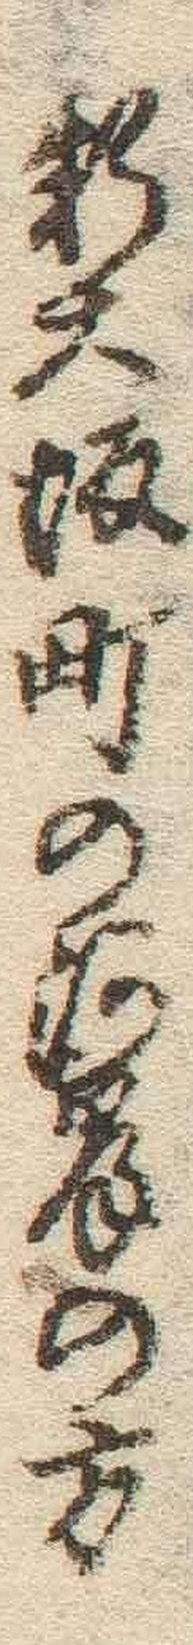新大坂町の河岸の方
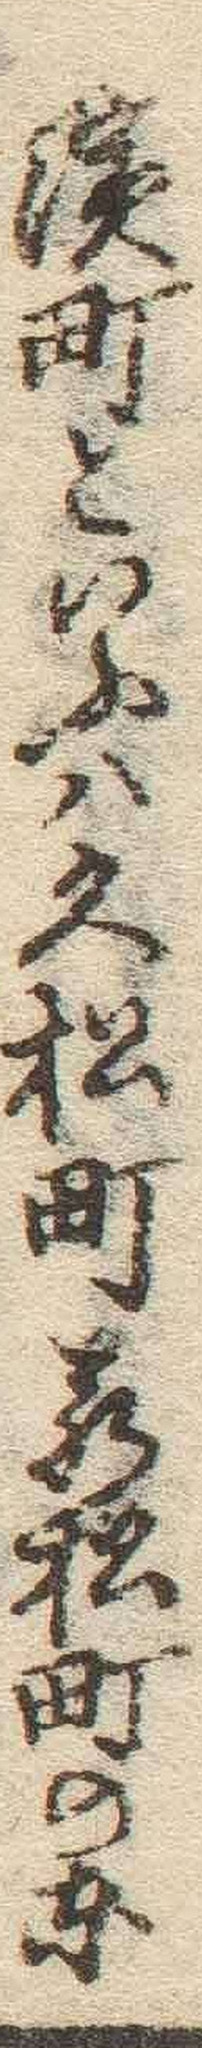浜町といふは久松町若松町の東
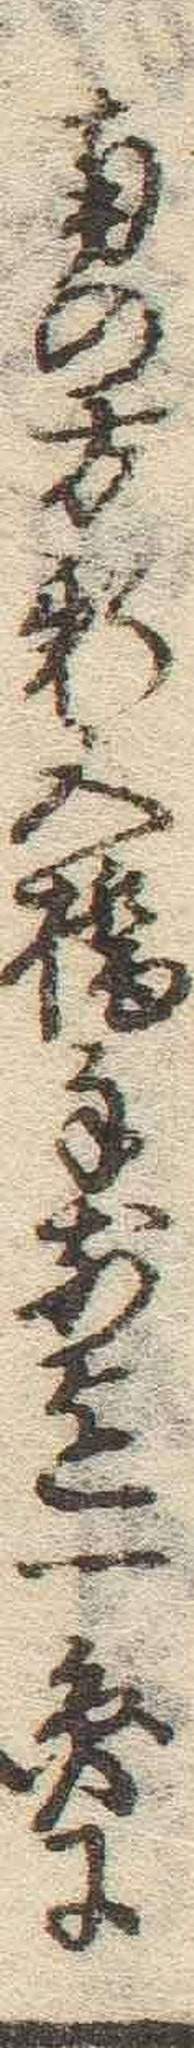南の方新大橋手前迄一円に
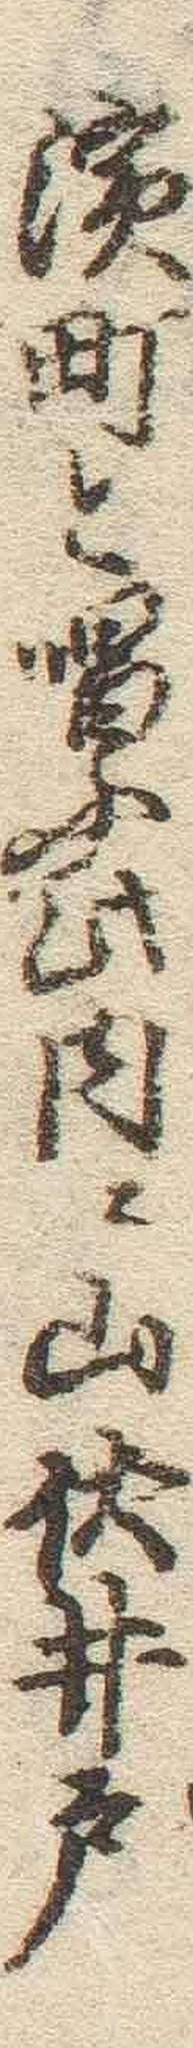浜町と唱ふ此内に山伏井戸
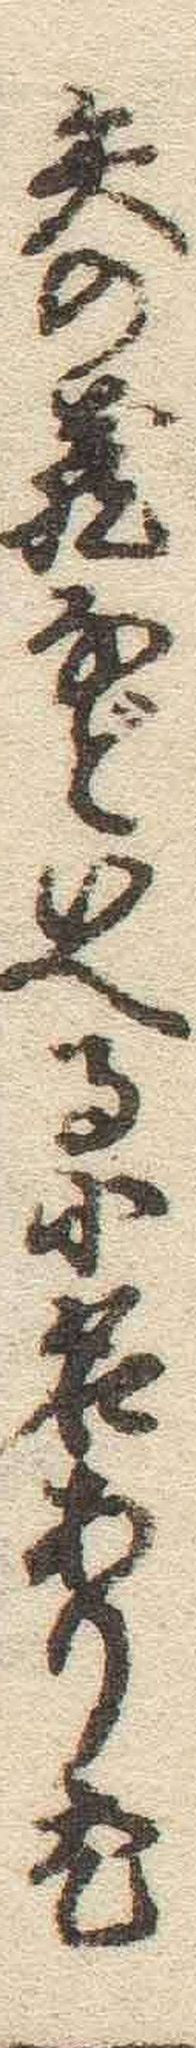矢の蔵などいへる小名あり尤
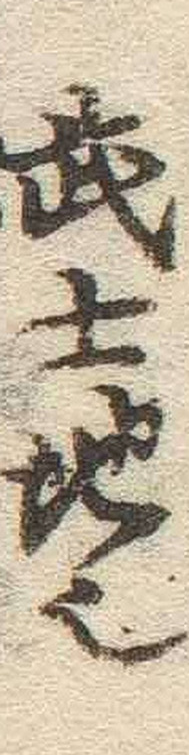武士地也
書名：江戸町独案内
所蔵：東京学芸大学附属図書館 国文学研究資料館
